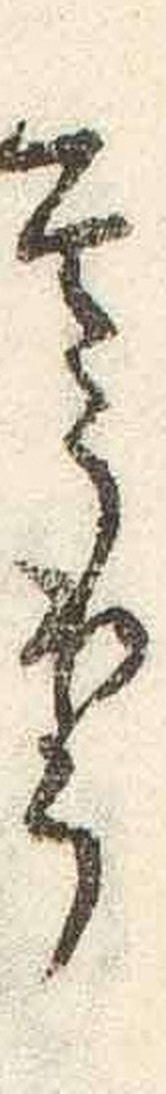そうほう
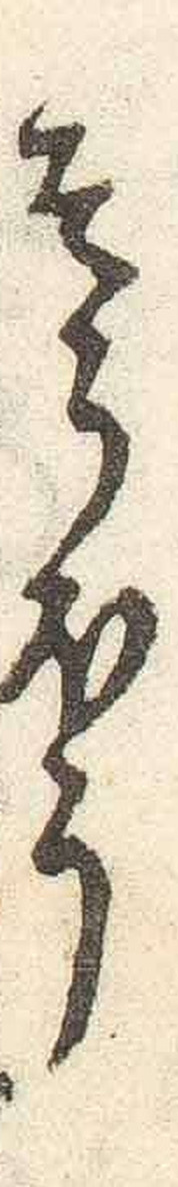そうほう
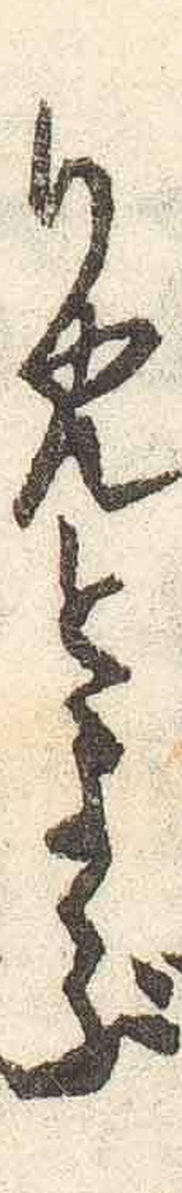りやんとよぶ
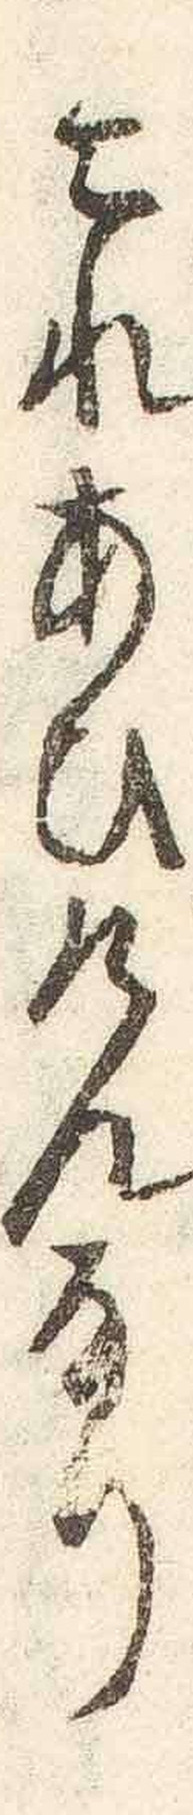これあひけんなり
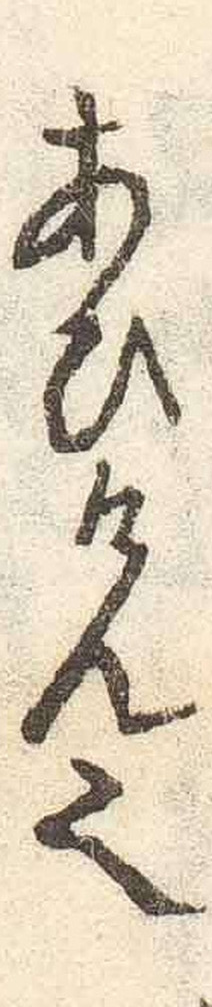あひけん也
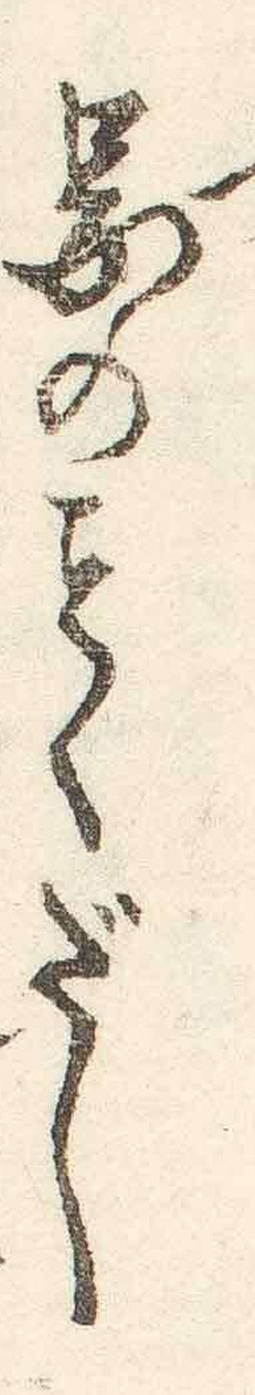図のことくだし
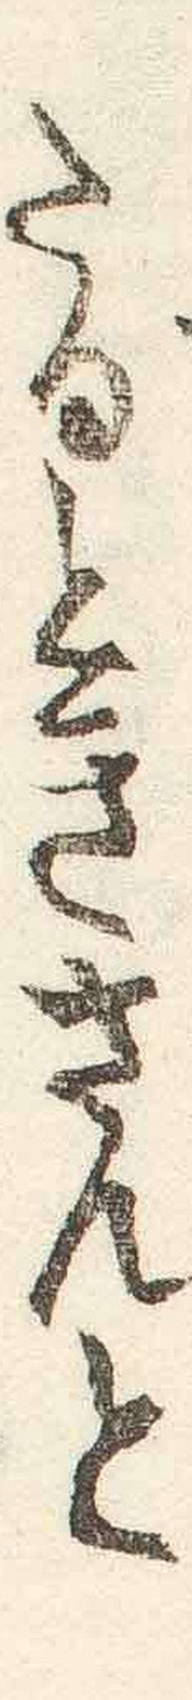たるときさんと
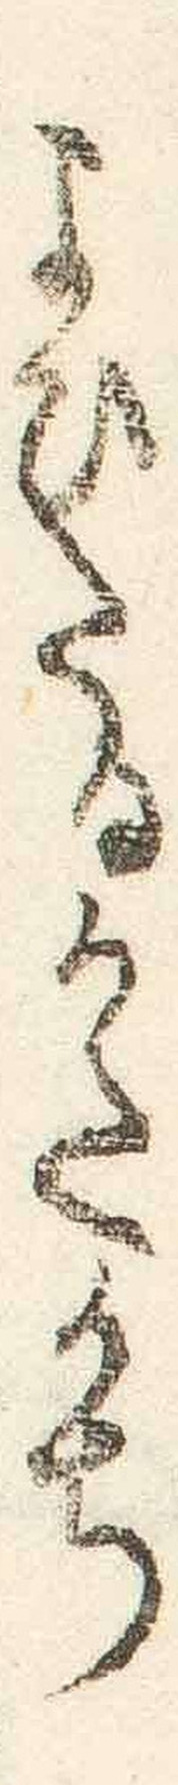よひたるかたかち
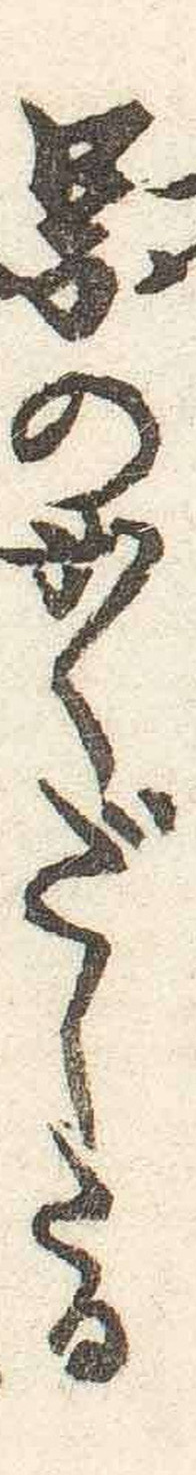図の如くだしたる
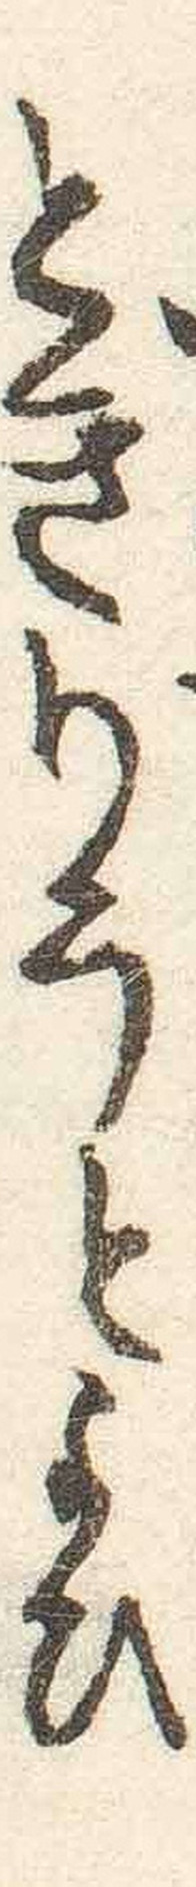ときりうとよひ
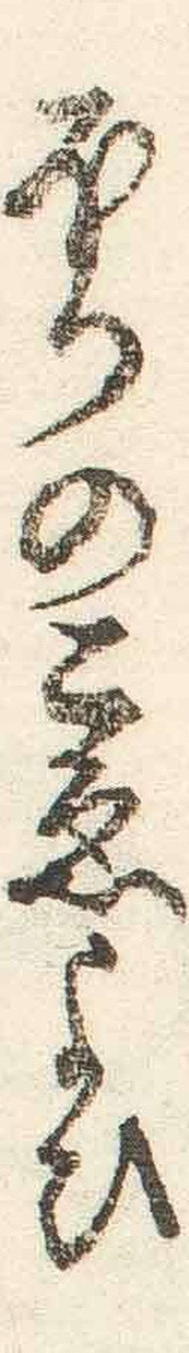ほかのこゑよひ
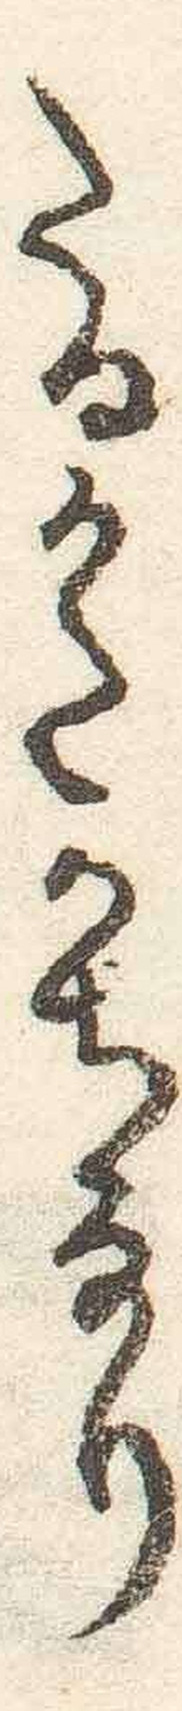たるかたかちなり
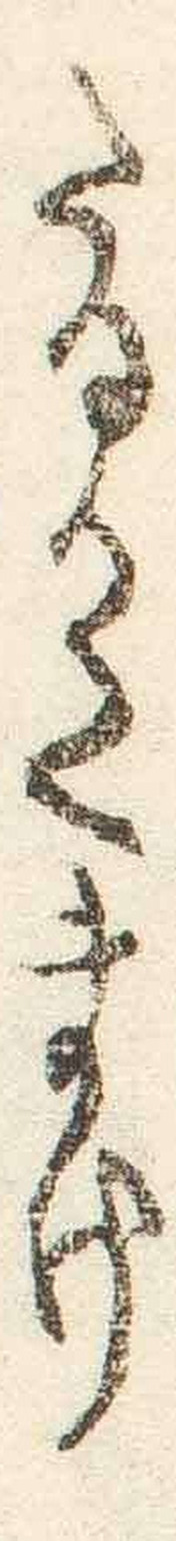たるかたまけ
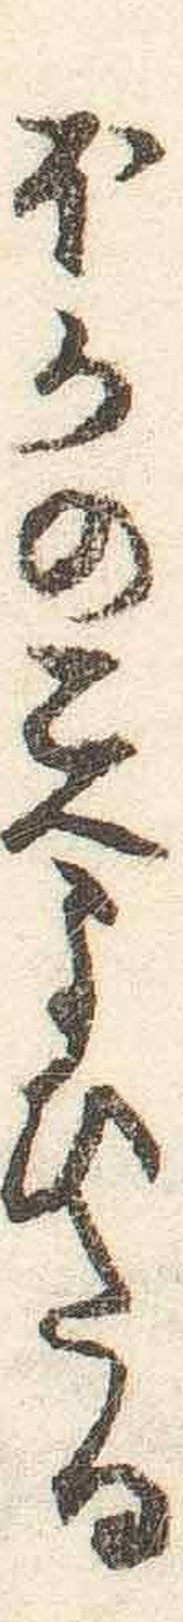ほかのこゑよひたる
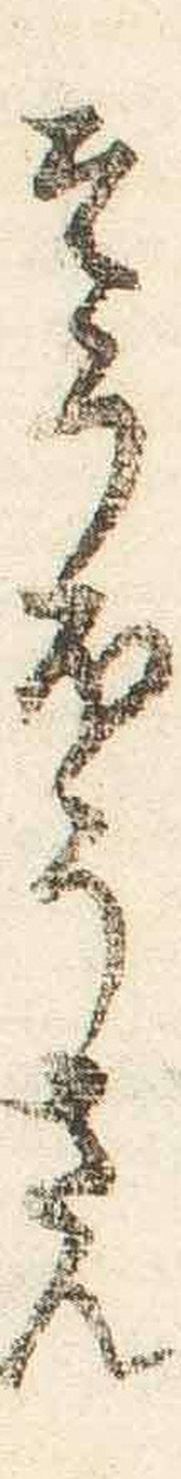そうほうさん
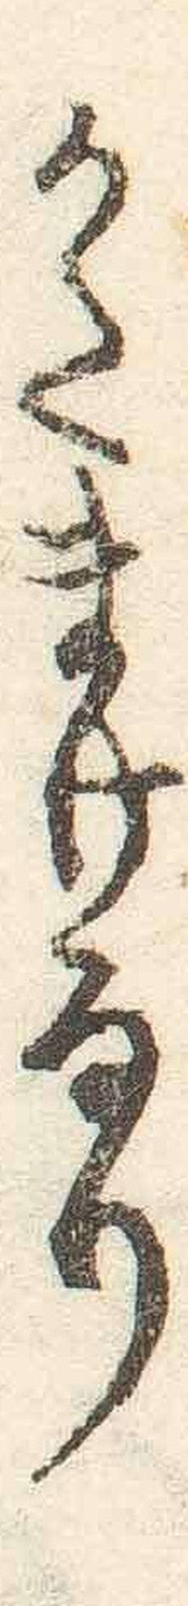かたまけなり
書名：拳独稽古
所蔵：東京学芸大学附属図書館 国文学研究資料館
